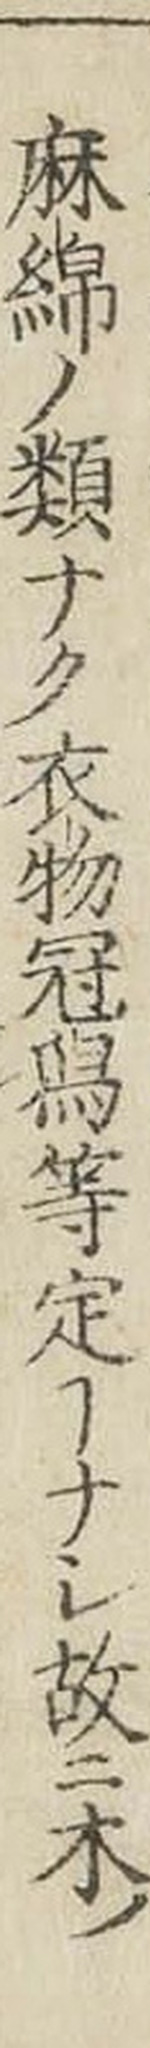麻-綿ノ類ナク衣-物冠-舃等定コトナシ故ニ木ノ
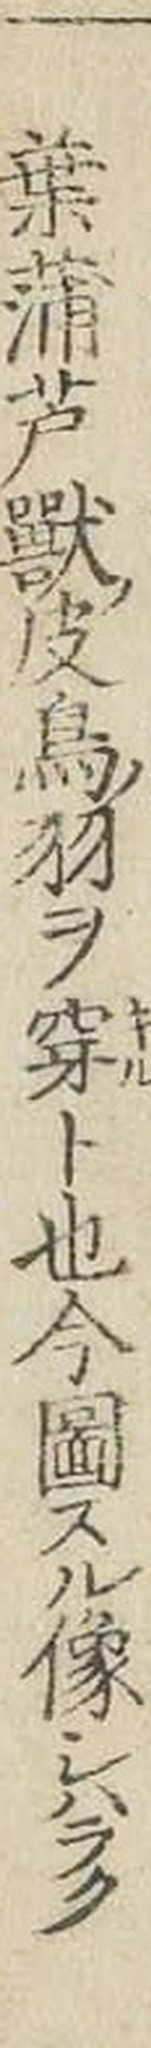葉蒲蘆獣皮鳥羽ヲ穿ト也今図スル像シハラク
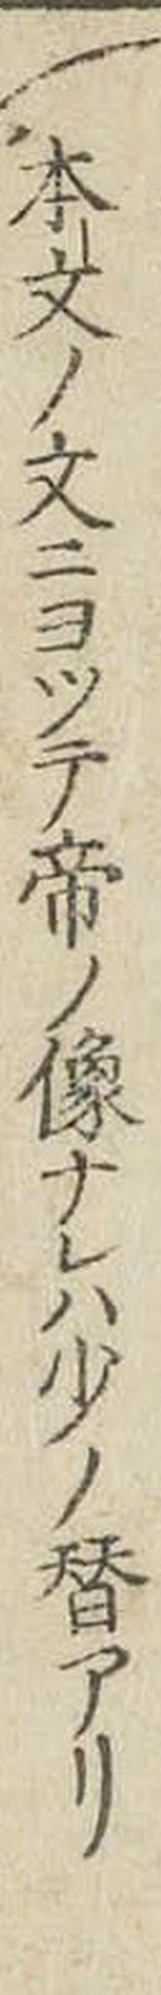本-文ノ文ニヨツテ帝ノ像ナレハ少ノ替アリ
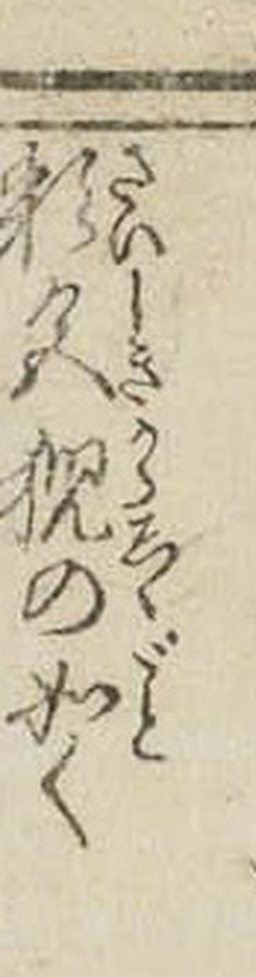彩色猊の如く
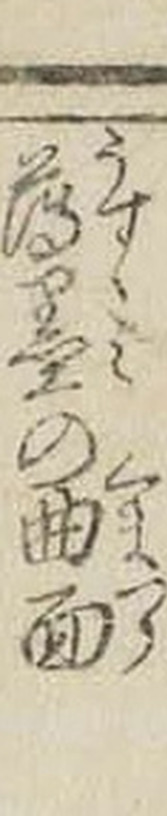薄墨の曲面
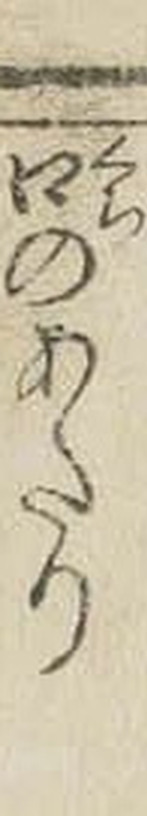口のあたり
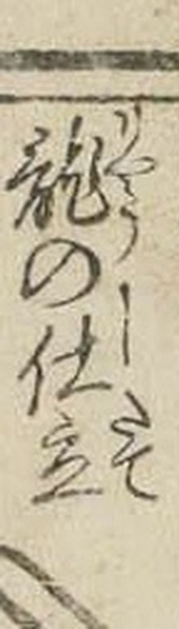竜の仕立
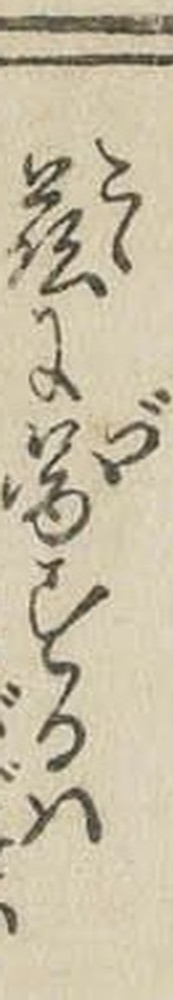茲に図するは
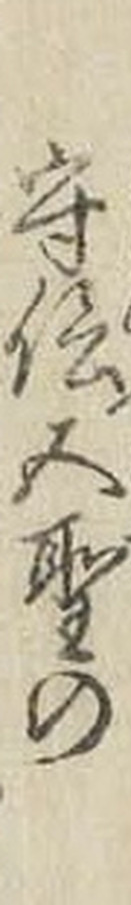守信五聖の
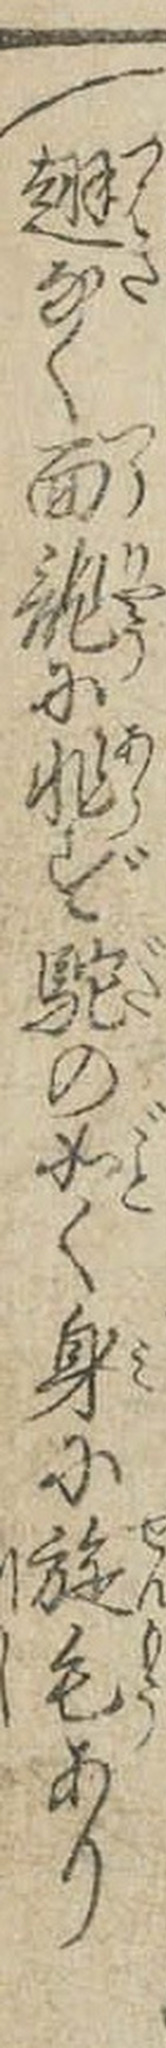趐なく面竜に非ず駝の如く身に旋毛あり
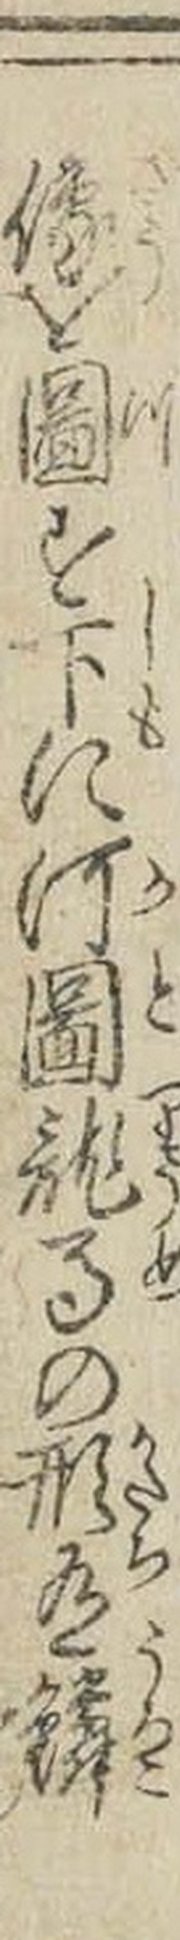像を図す下に河図竜馬の形有鱗

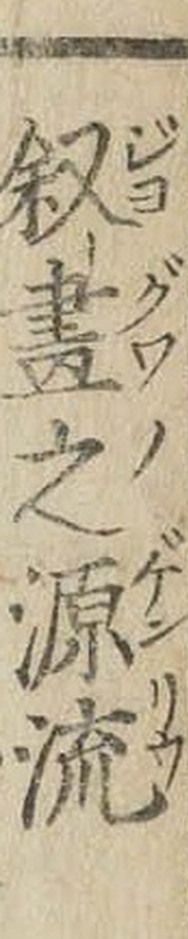叙-画之源流
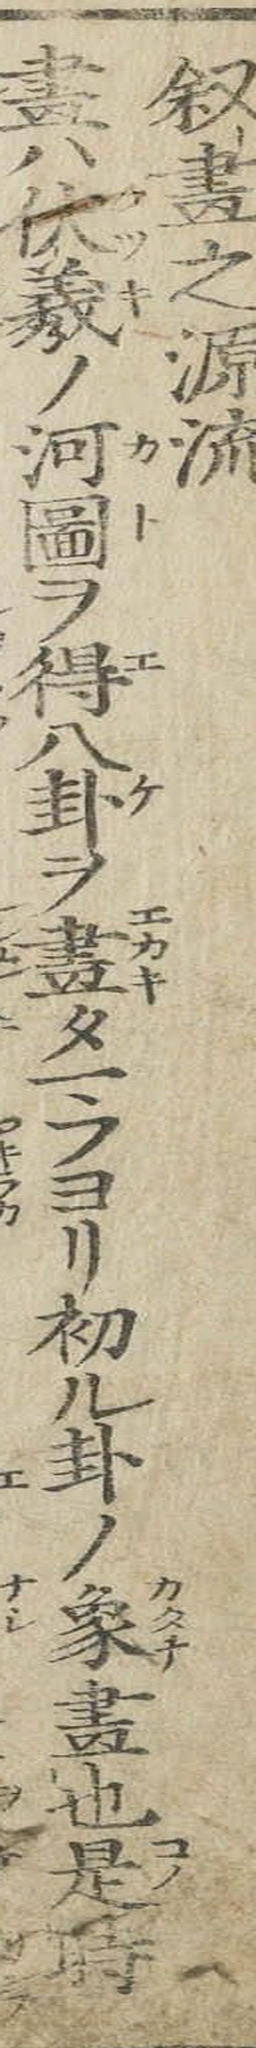画ハ伏-羲ノ河図ヲ得八卦ヲ画タマフヨリ初ル卦ノ象画-也是時
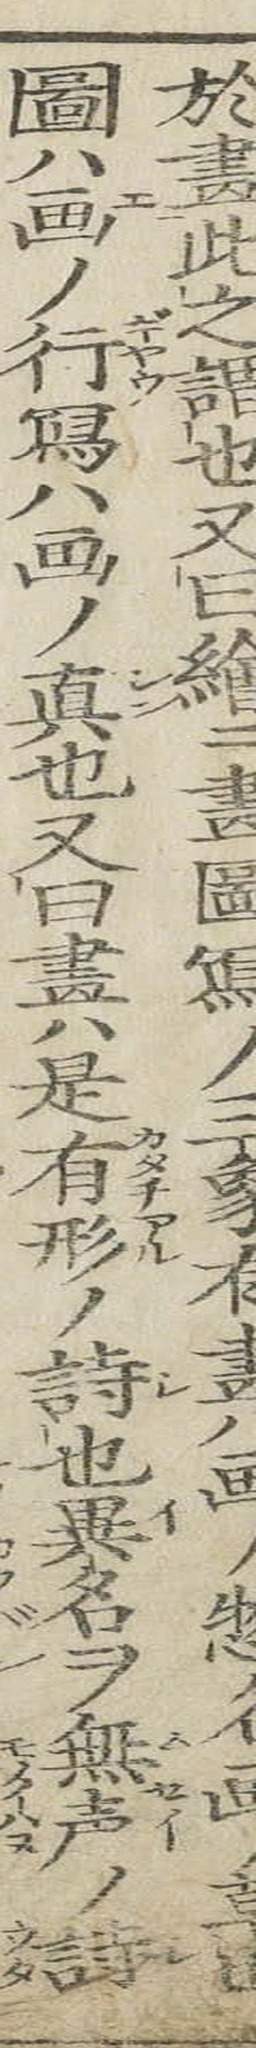図ハ画ノ行写ハ画ノ真也又-曰画ハ是有形ノ詩-也異-名ヲ無声ノ詩
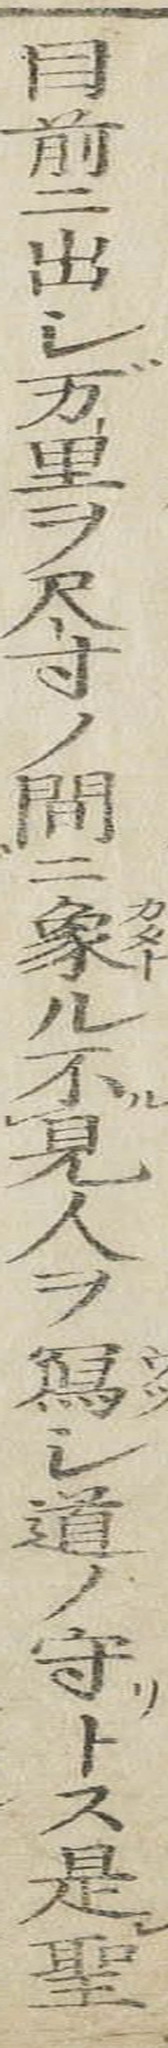目前ニ出シ〝万-里ヲ尺-寸ノ間ニ象ル不見人ヲ写シ道ノ守トス是聖
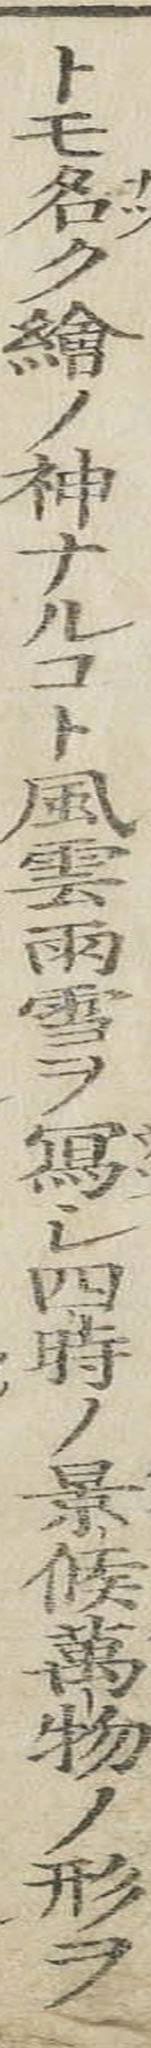トモ名ク絵ノ神ナルコト風雲雨雪ヲ写シ四時ノ景-候万-物ノ形ヲ
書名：絵本写宝袋 9巻 4之巻
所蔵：東京学芸大学教育コンテンツアーカイブ
